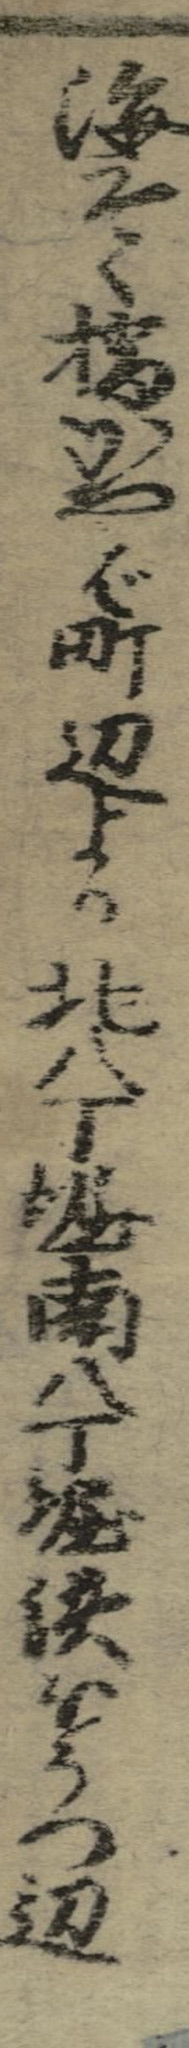海そく橋かやば町辺より北八丁堀南八丁堀鉄ほうつ辺
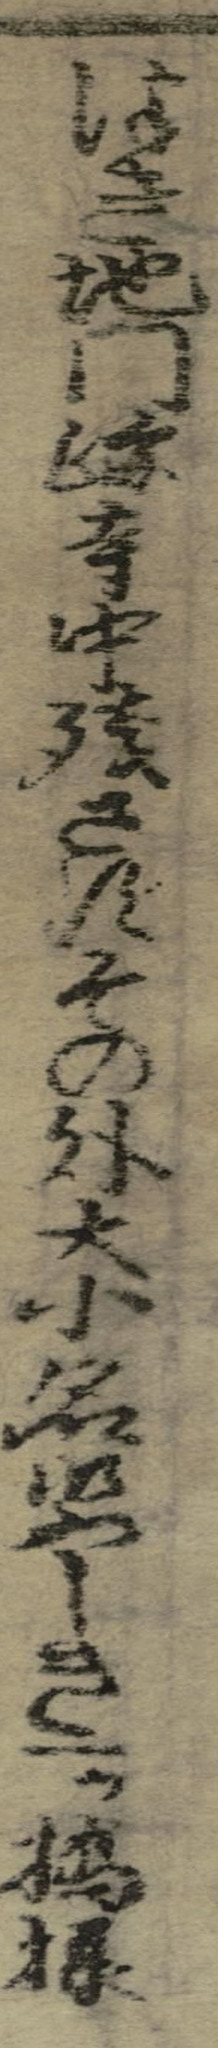つき地門跡寺中残さすその外大小名やしき一ッ橋様
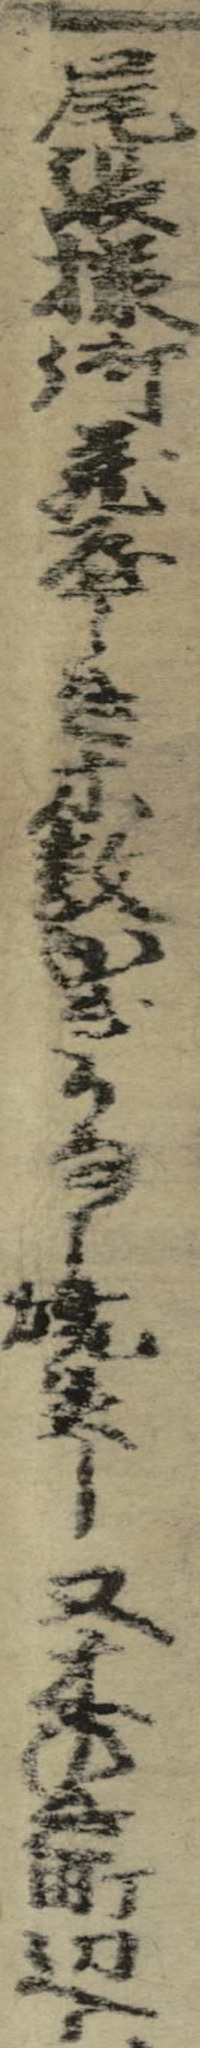尾張様御蔵やしき等数かきりなく焼失し又木ひき町辺ハ
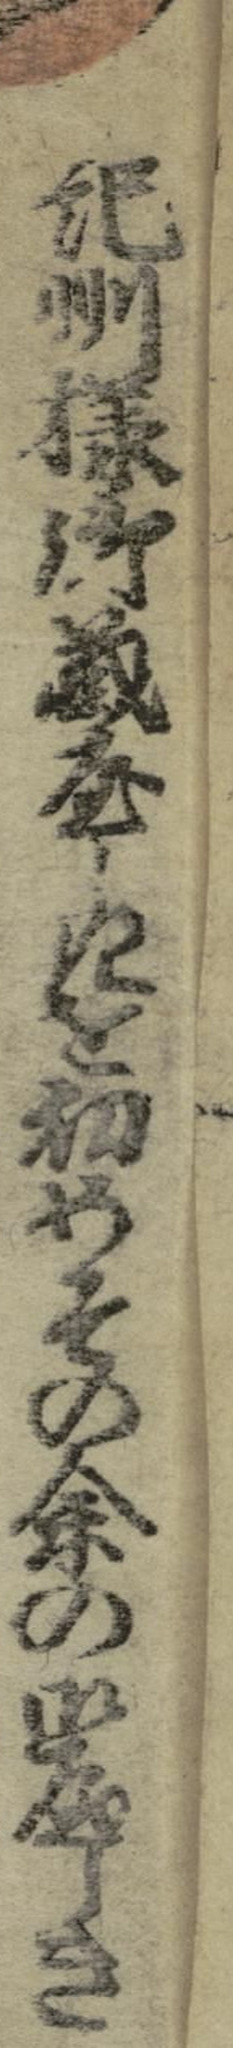紀州様御蔵やしきを初めその余の御やしき
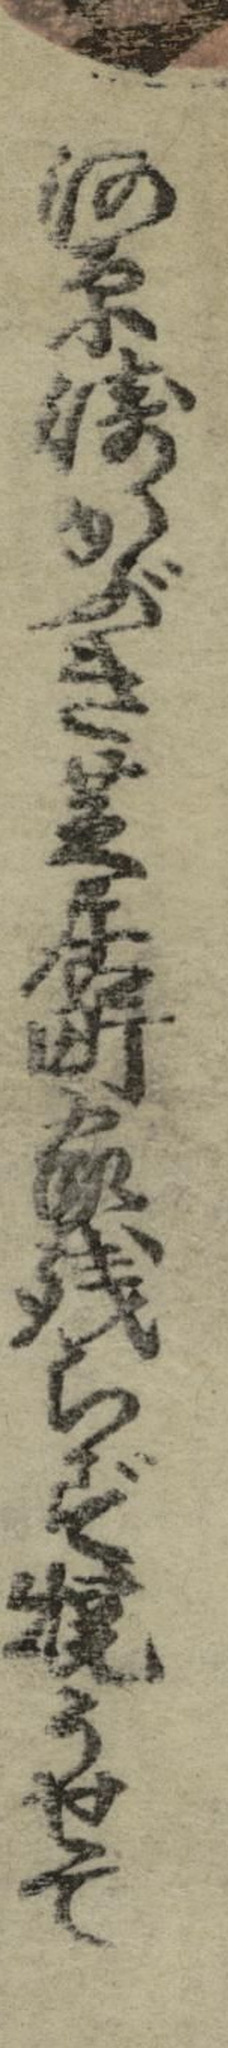河原崎かぶき芝居町家残らず焼うせて
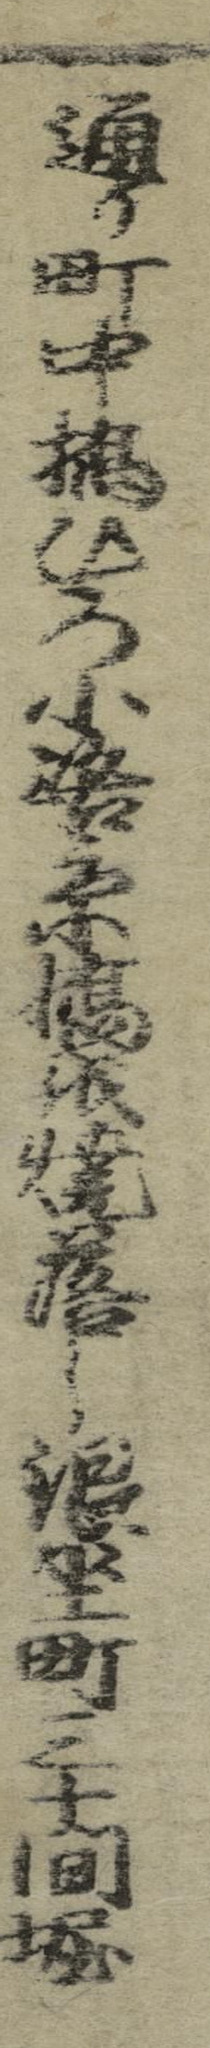通り町中ひろ小路京橋を焼落し銀坐町三十間堀
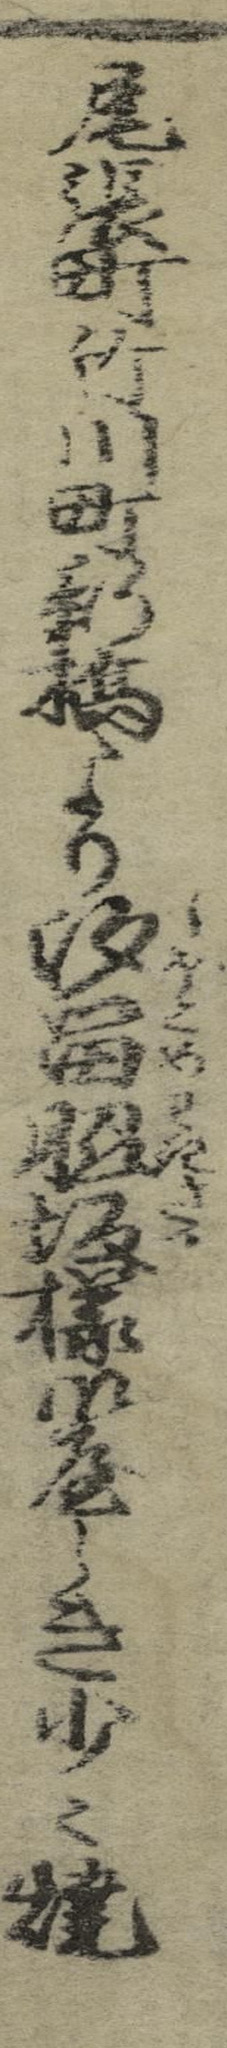尾張町竹川丁新橋より汐留脇坂様御やしき少々焼
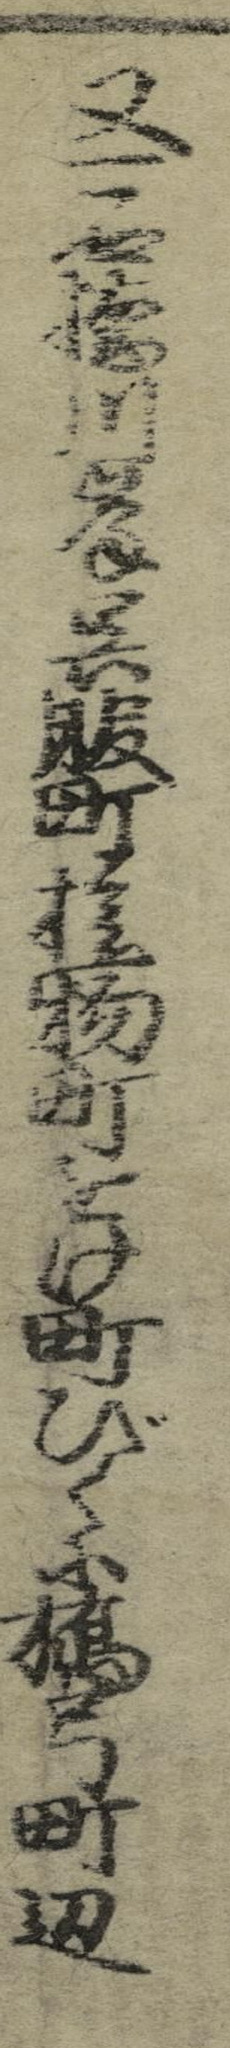又一石橋川岸呉服丁檜物町をけ町びくに橋弓町辺
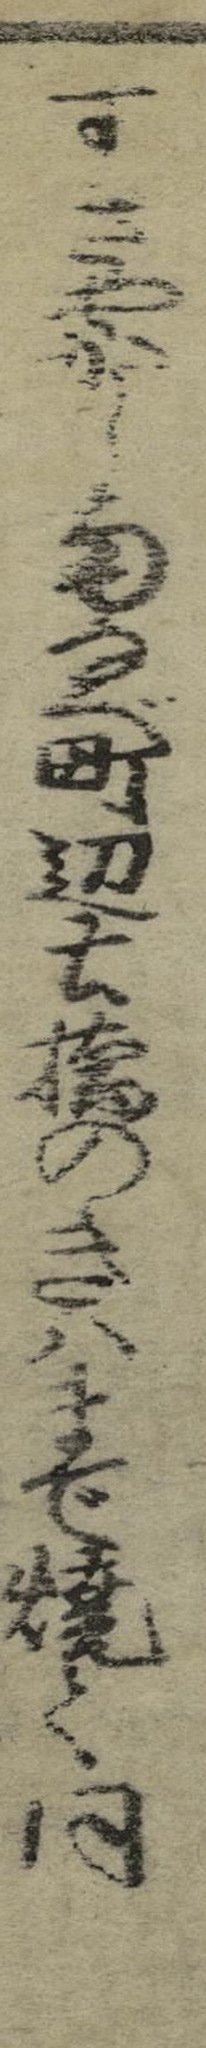すきやばし南なべ町辺土橋のきハまで焼て同
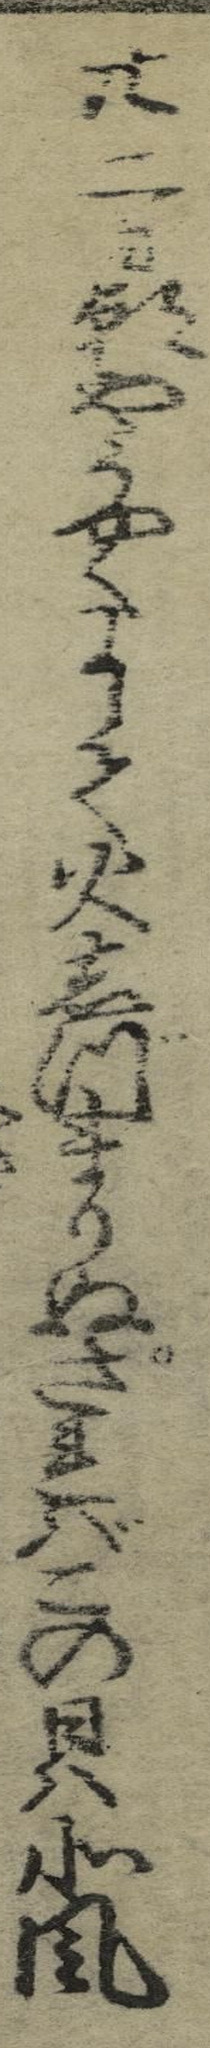廿二日朝やうやくにて火しつまりぬさればこの日ハ北風
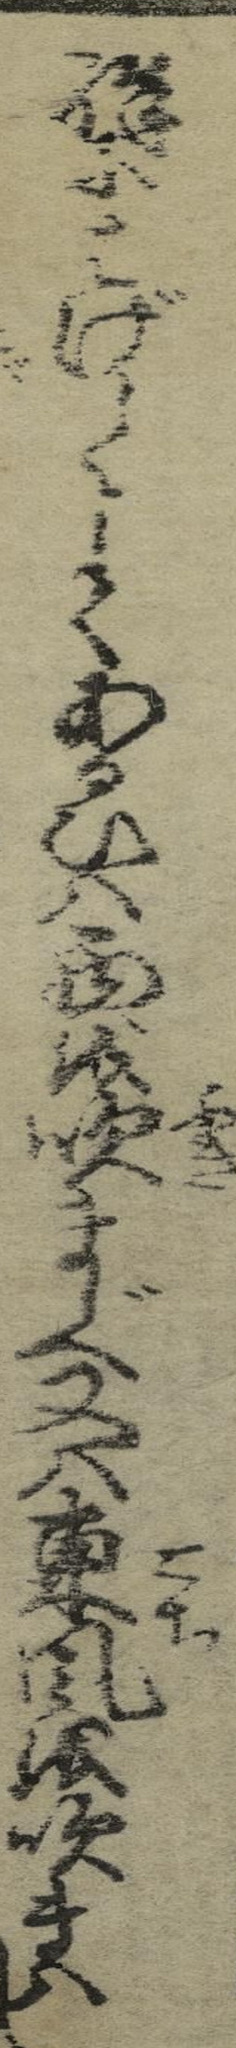殊にはげしくてあるひハ西を吹まじへ又ハ東風吹まハし
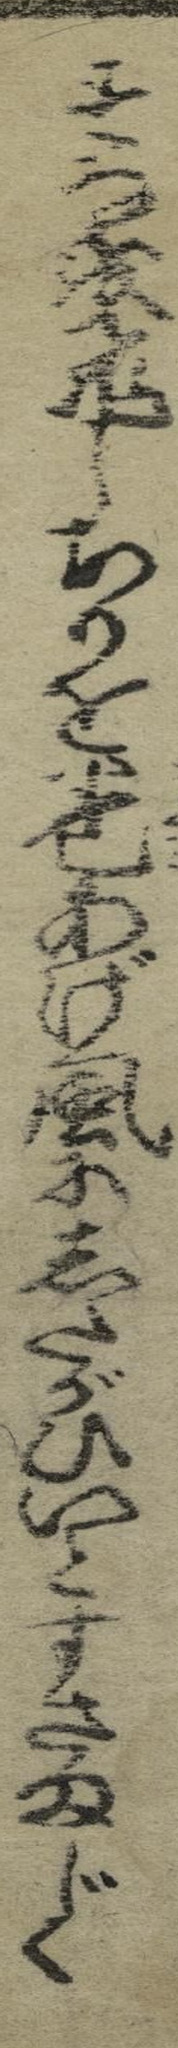すなを飛しちりを巻あげ風にしたがひいとすさまじく
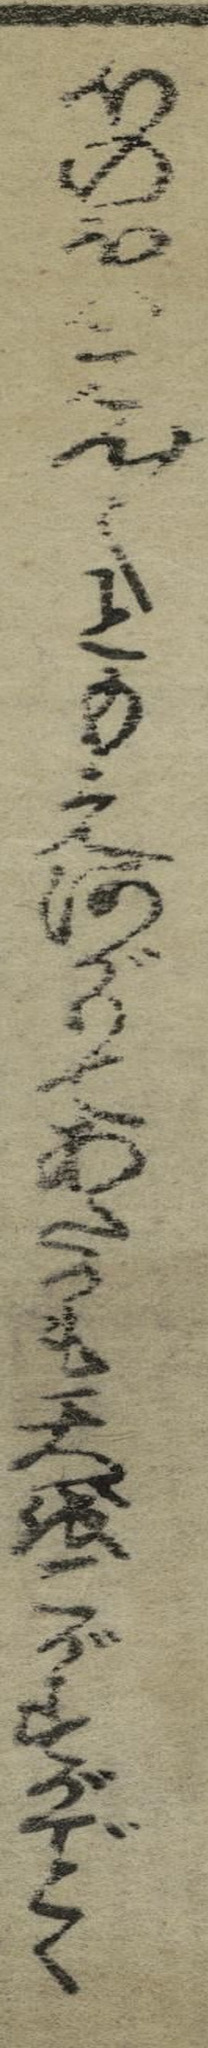ほのほえん〳〵ともえあがりあたかも天をこがすがごとく
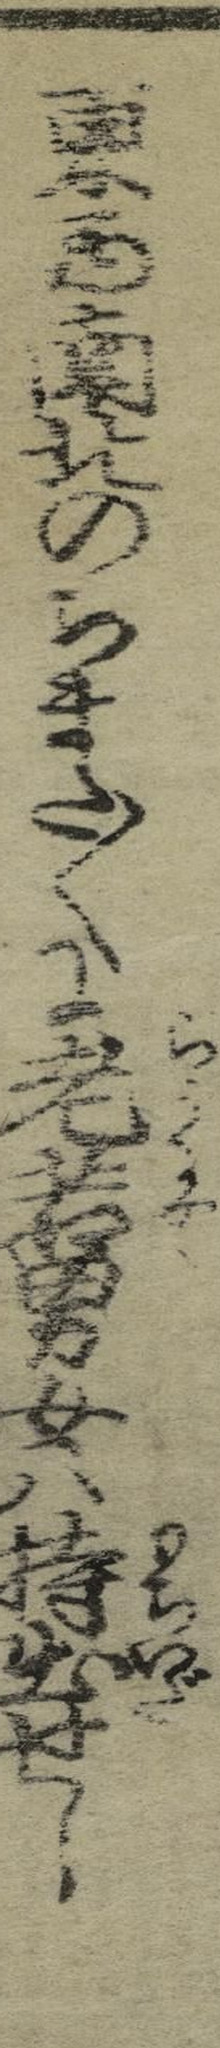東西南北のちまた〳〵に老若男序ハ持出せし
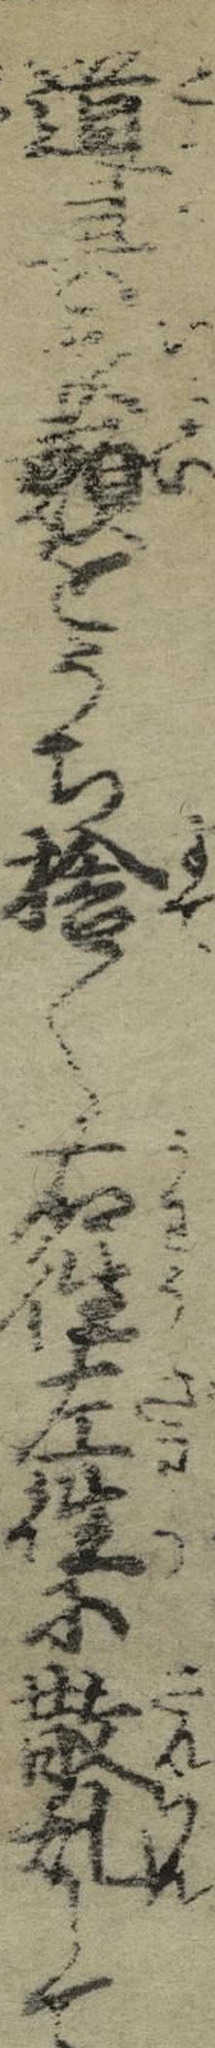道具衣類をうち捨〳〵右往左往に散乱して
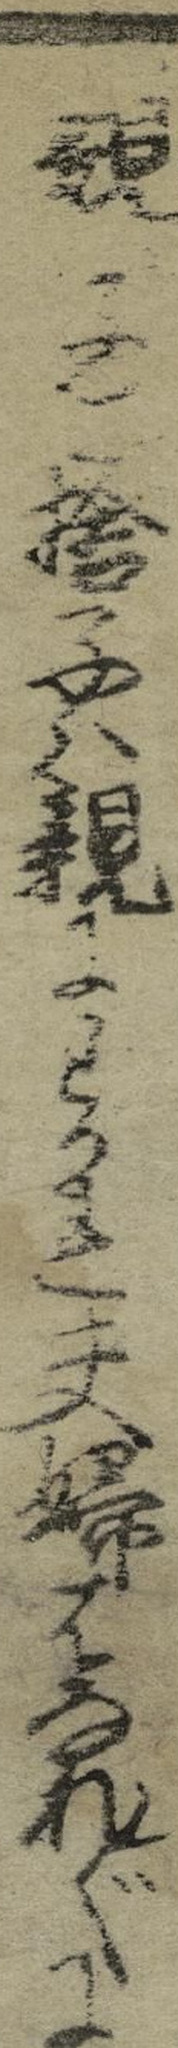親ハ子を捨子ハ親にわかれ夫婦はなれ〴〵に
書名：[文政十二年三月の江戸大火に関する瓦版]
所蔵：東京大学地震研究所図書室 Earthquake Research Institute Library, The University of Tokyo, JAPAN
